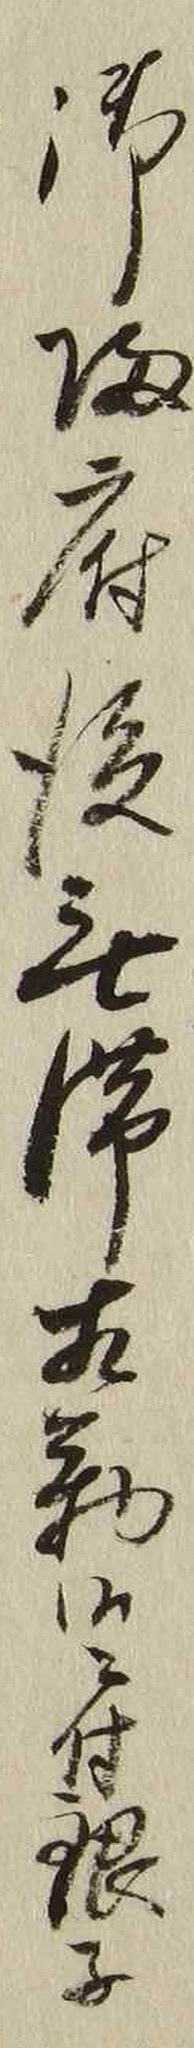御帰府後無滞相勤候ニ付銀子
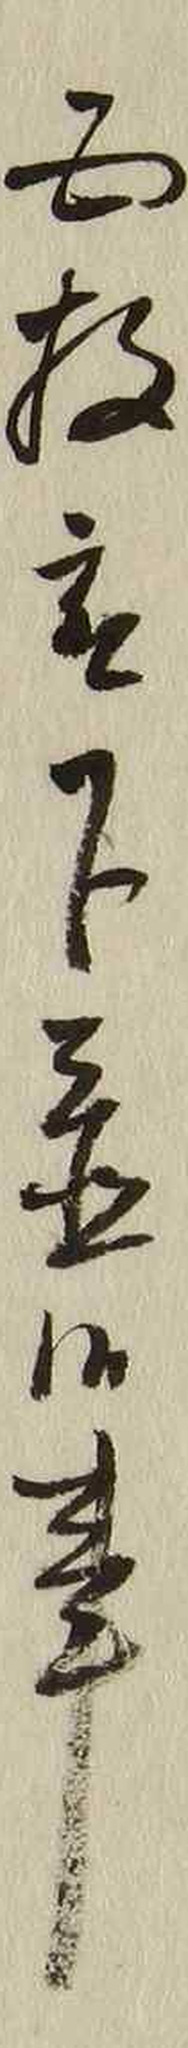五枚被下置候事
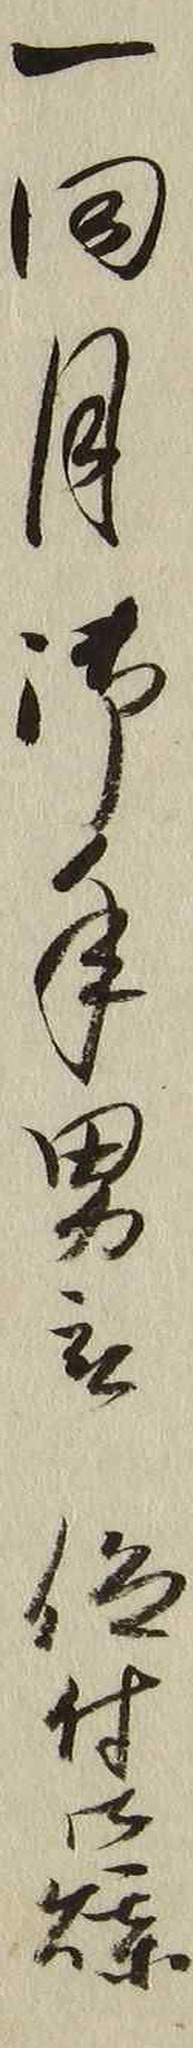一同月御年男被仰付御煤
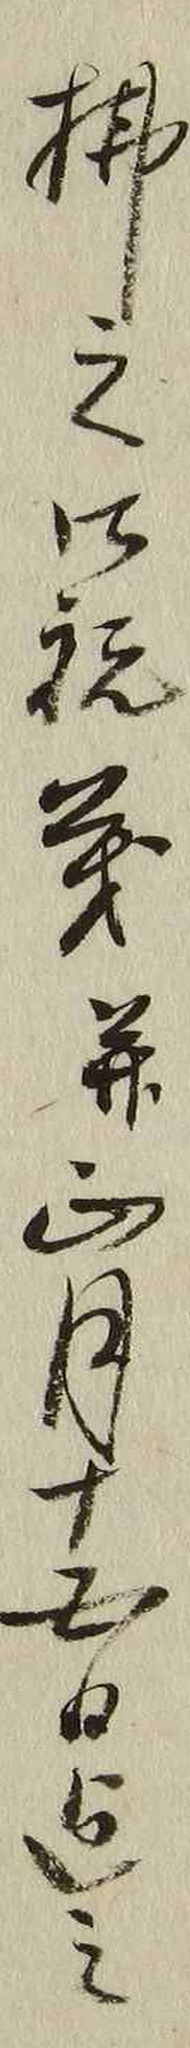払之御祝義并正月十五日迄之
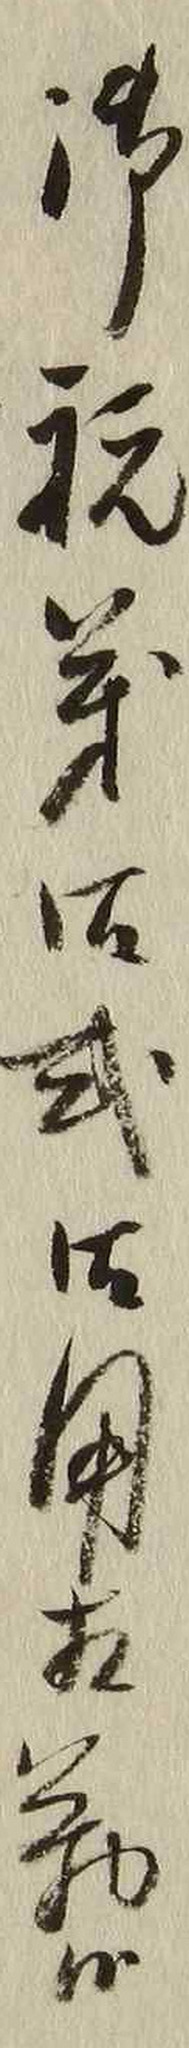御祝義御式御用相勤候
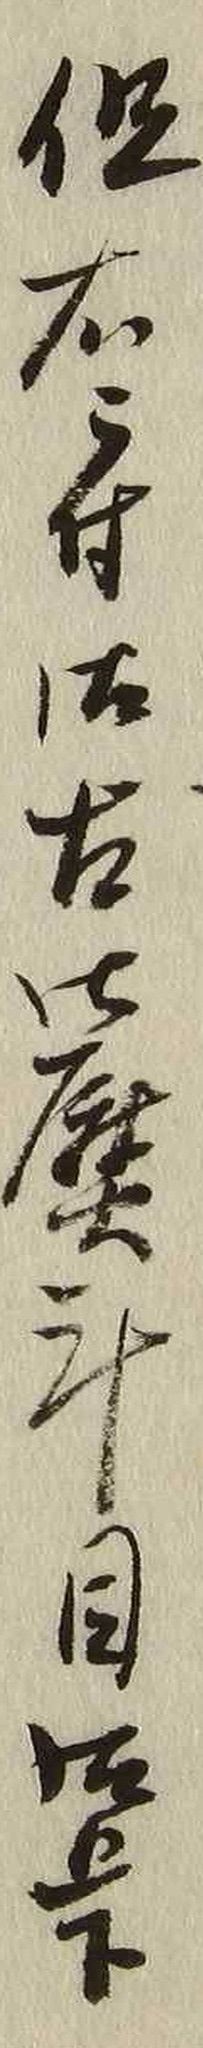但右ニ付御古御熨斗目御上下
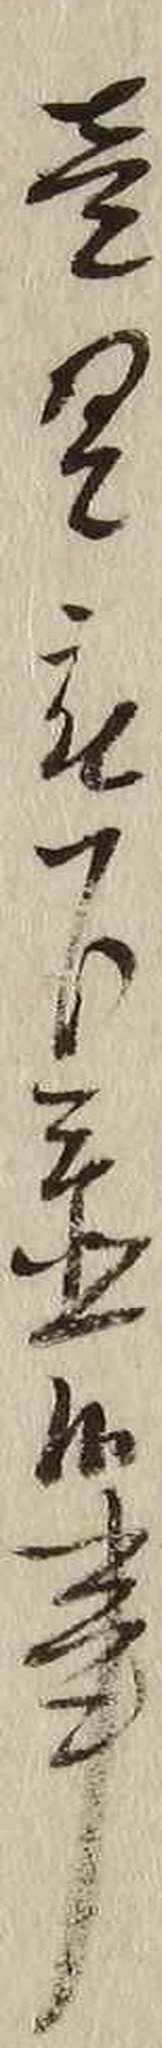壱具被下置候事
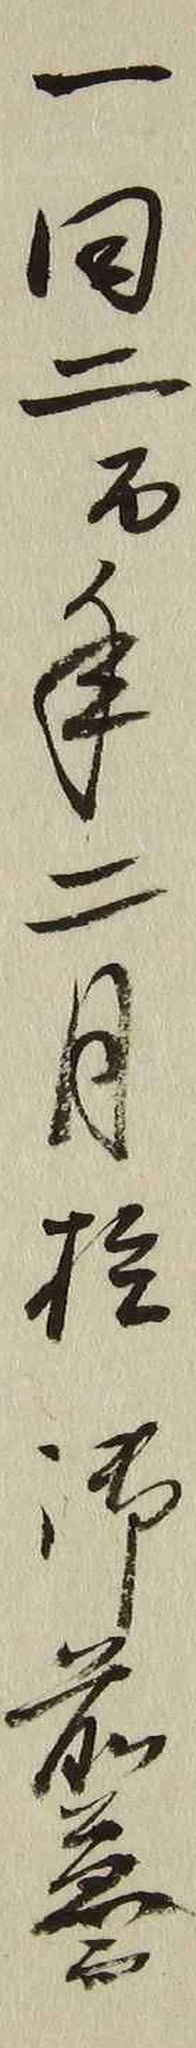一同二酉年二月於御前兼而
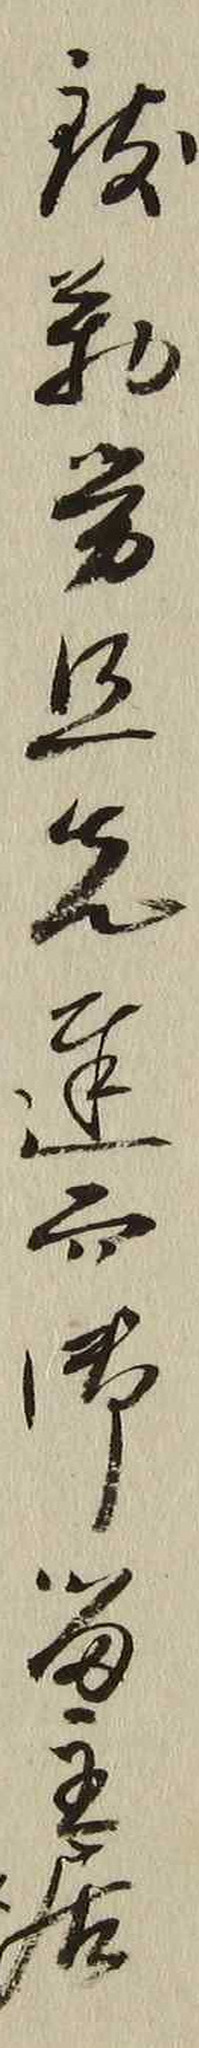致勤労且先達而御留主居
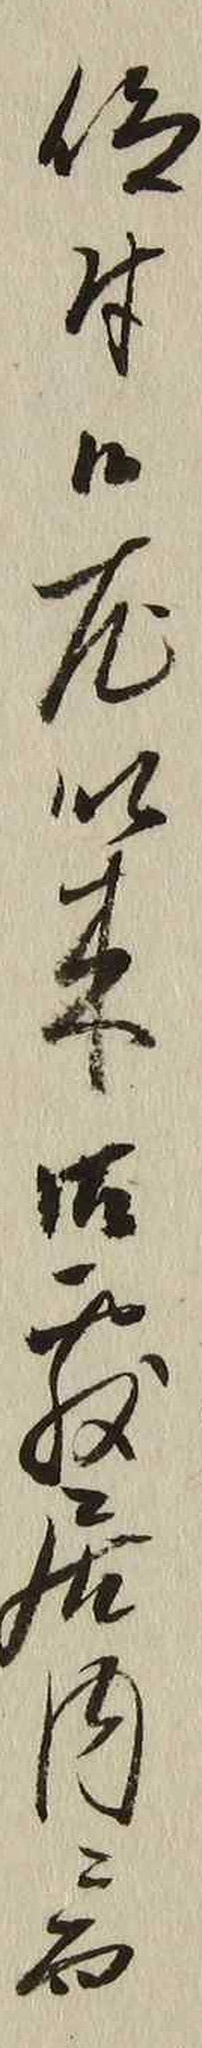仰付候尤以来御敷居内ニ而
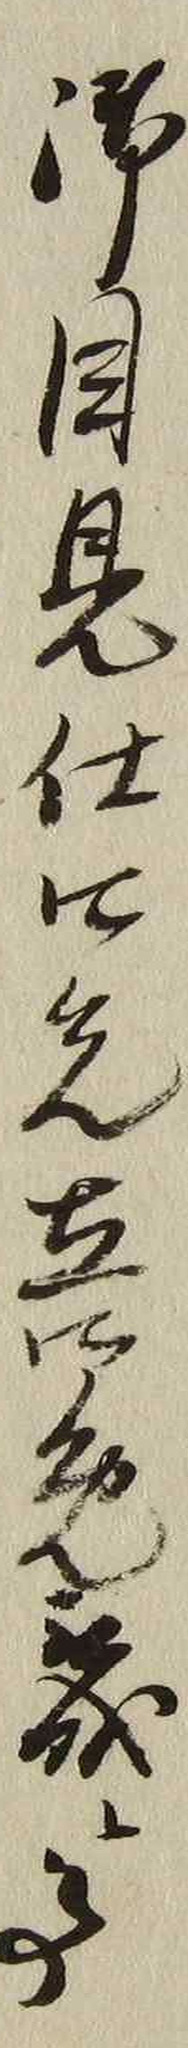御月見仕御先立御免被成候事
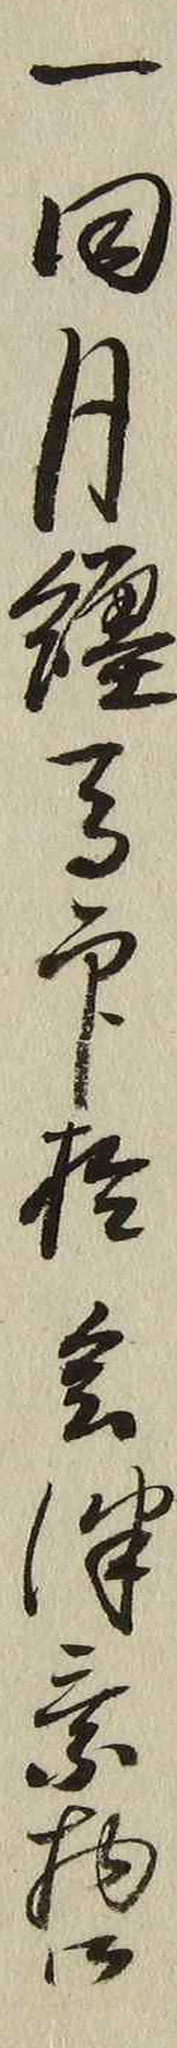一同月纏馬印於会津乗物御
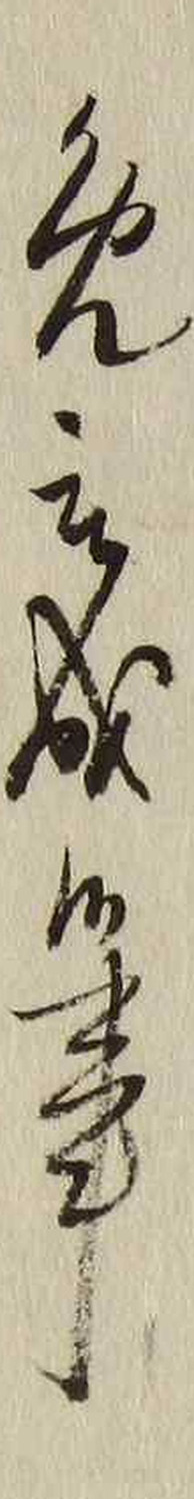免被成候事
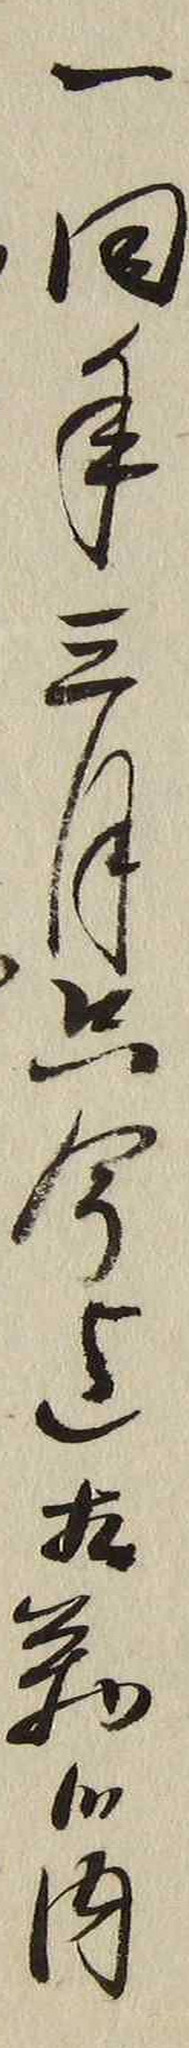一同年三月只今迄相勤候内
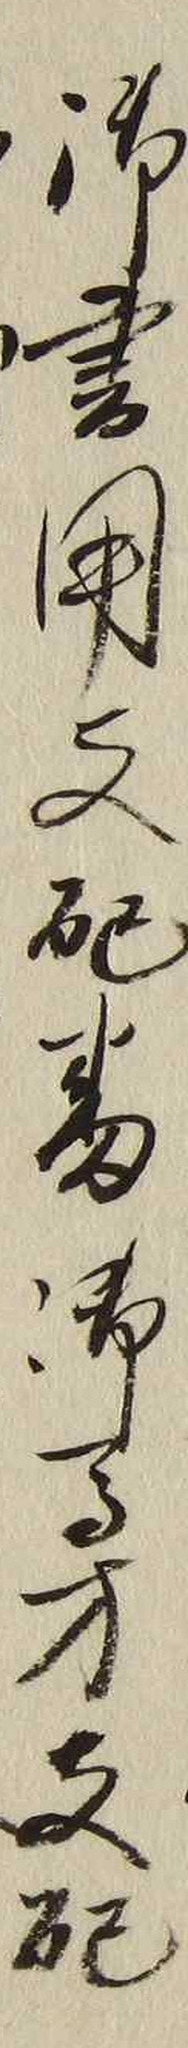御書用支配番御馬方支配
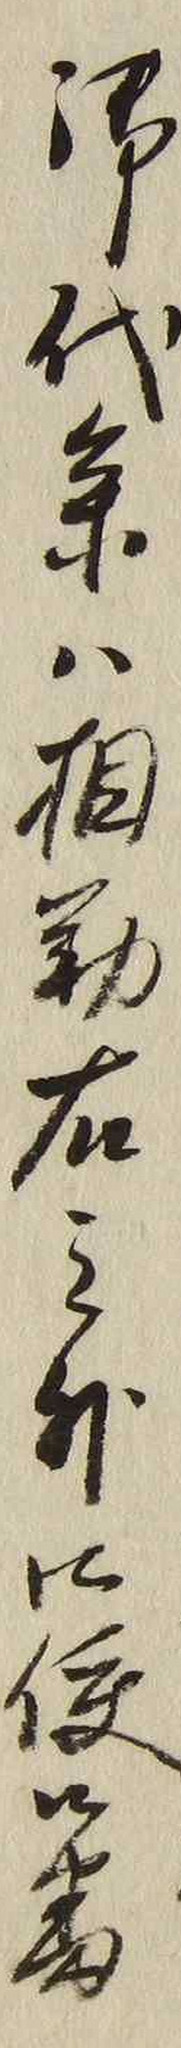御代参ハ相勤右之外御使御番
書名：諸士系譜　巻之355　す之部5
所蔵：会津若松市立会津図書館
